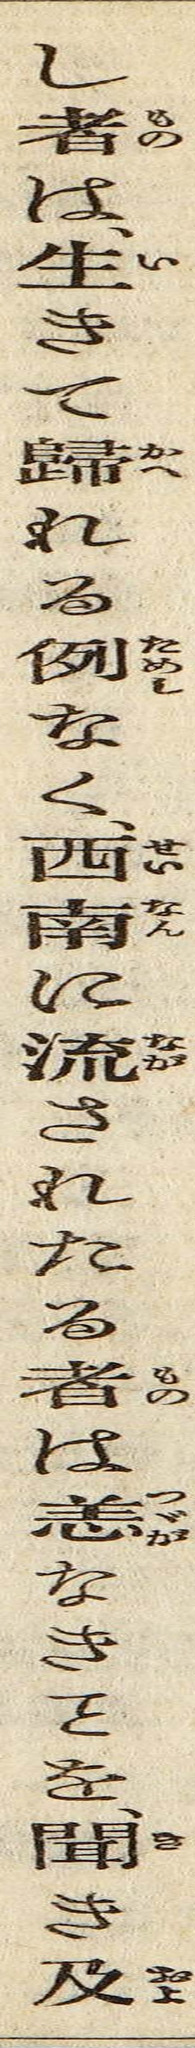し者は、生きて帰れる例なく、西南に流されたる者は恙なきことを、聞き及
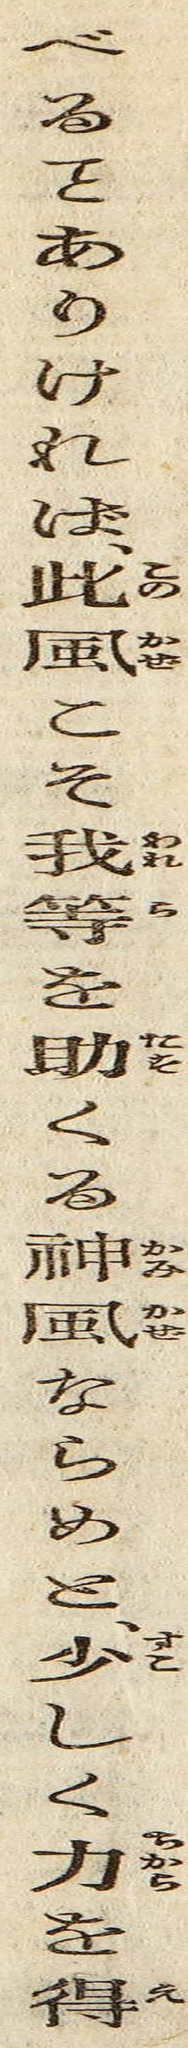べることありければ、此風こそ我等を助くる神風ならめと、少しく力を得
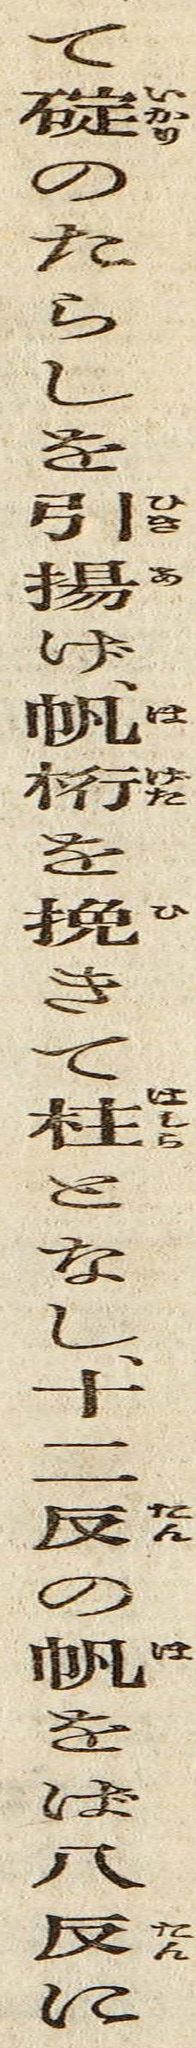て碇のたらしを引揚げ、帆桁を挽きて柱となし、十二反の帆をば八反に
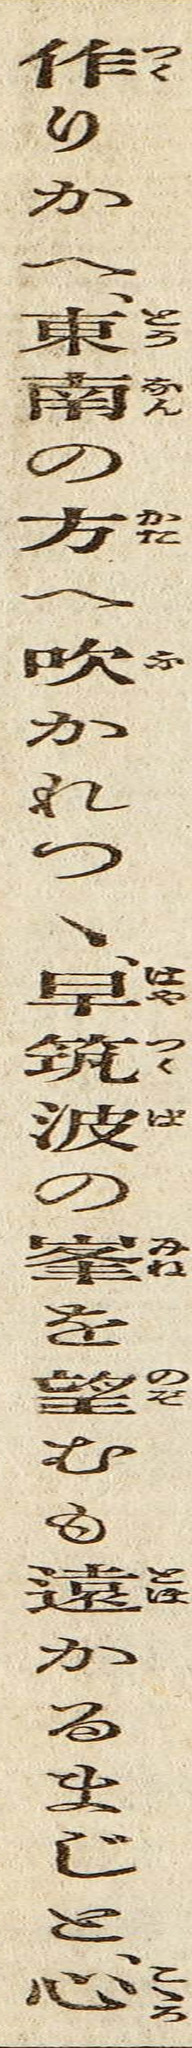作りかへ、東南の方へ吹かれつヽ、早筑波の峯を望むも遠かるまじと、心
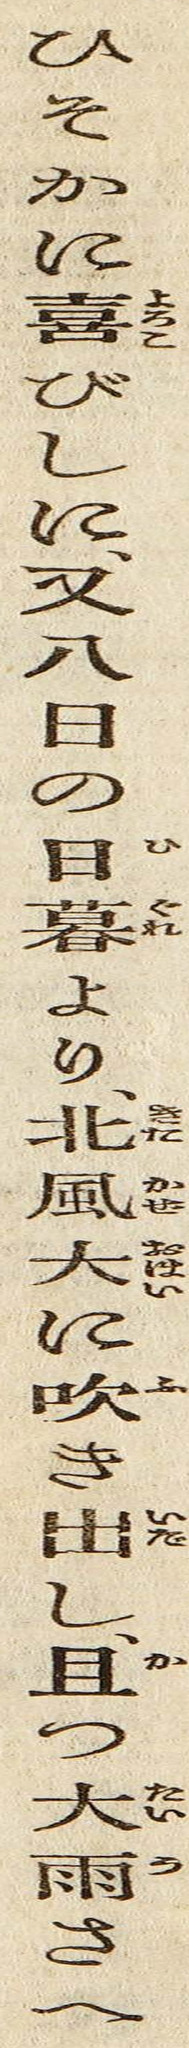ひそかに喜びしに、又八日の日暮より、北風大に吹き出し、且つ大雨さへ
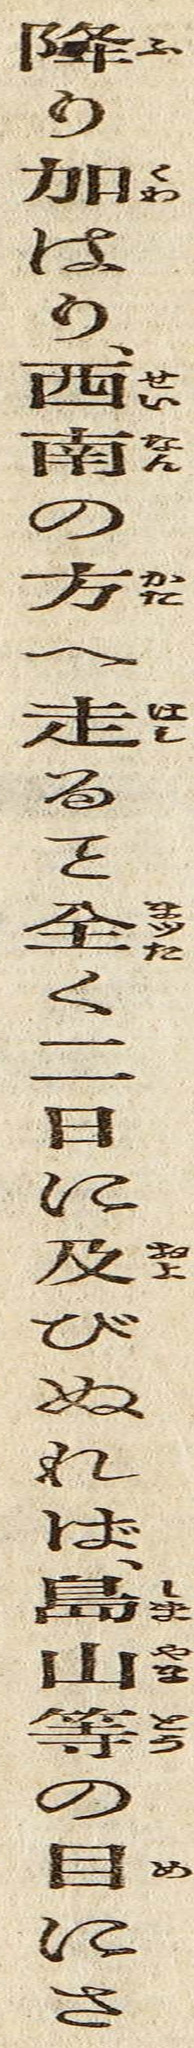降り加はり、西南の方へ走ること全く二日に及びぬれば、島山等の目にさ
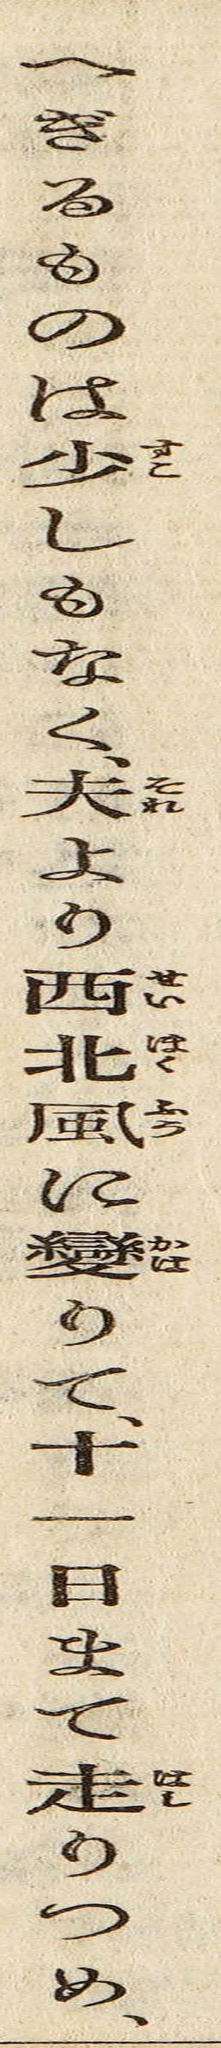へぎるものは少しもなく、夫より西北風に変りて、十一日まて走りつめ、
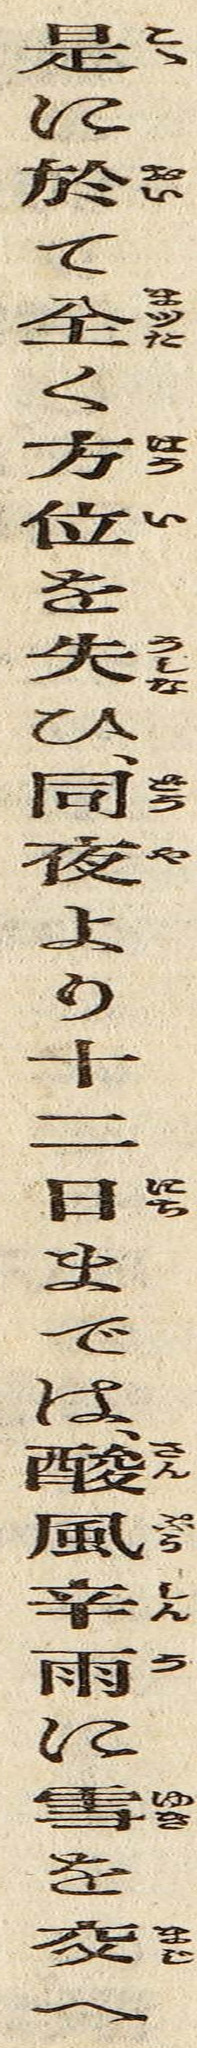是に於て全く方位を失ひ、同夜より十二日までは、酸風辛雨に雪を交へ
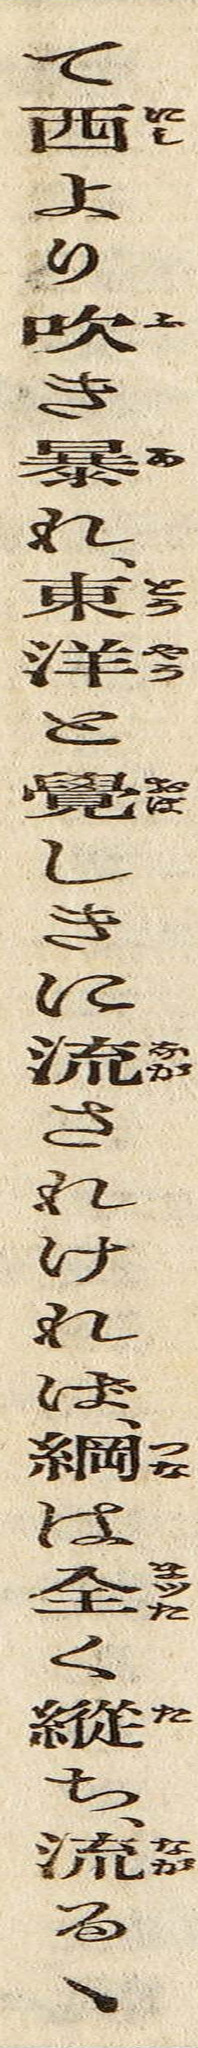て西より吹き暴れ、東洋と覚しきに流されければ、綱は全く縦ち、流るヽ
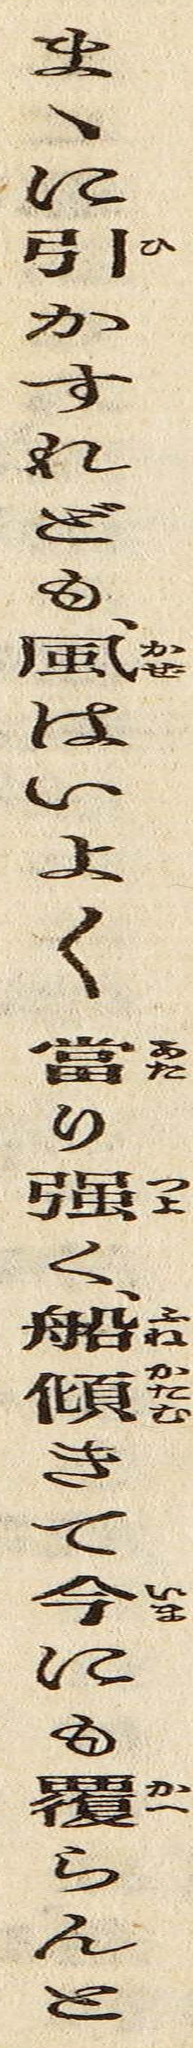まヽに引かすれども、風はいよ〳〵当り強く、船傾きて今にも覆らんと
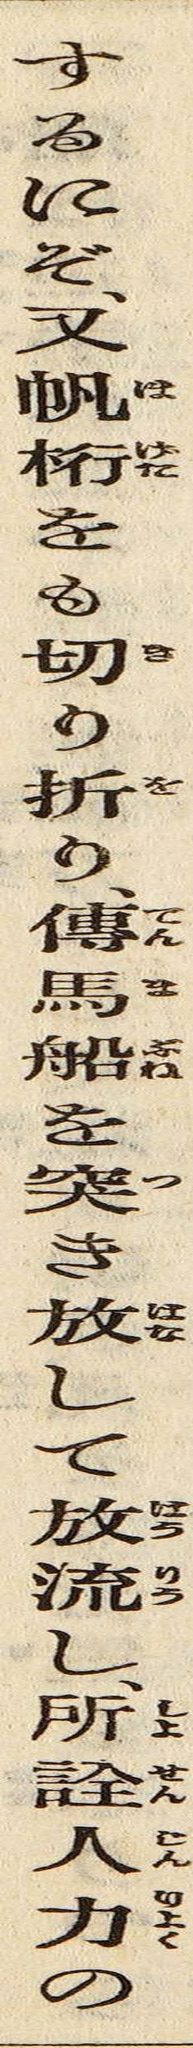するにぞ、又帆桁をも切り折り、伝馬船を突き放して放流し、所詮人力の
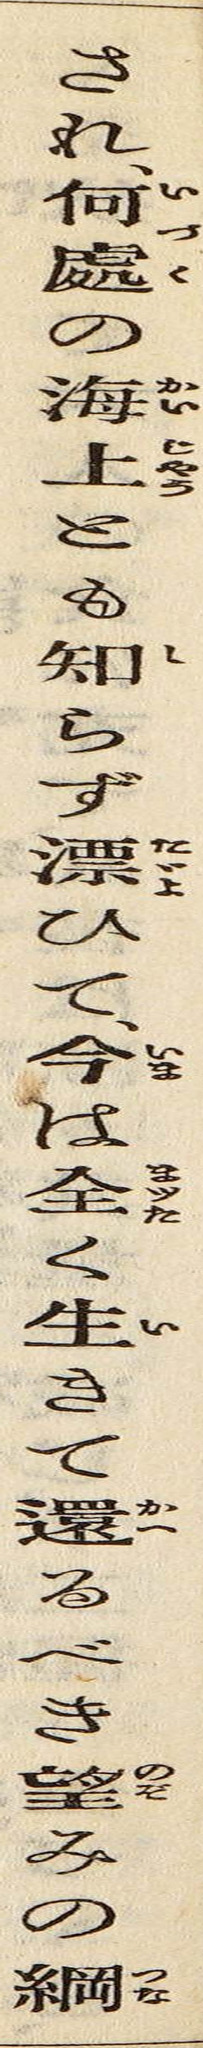され、何処の海上とも知らず漂ひて、今は全く生きて還るべき望みの綱
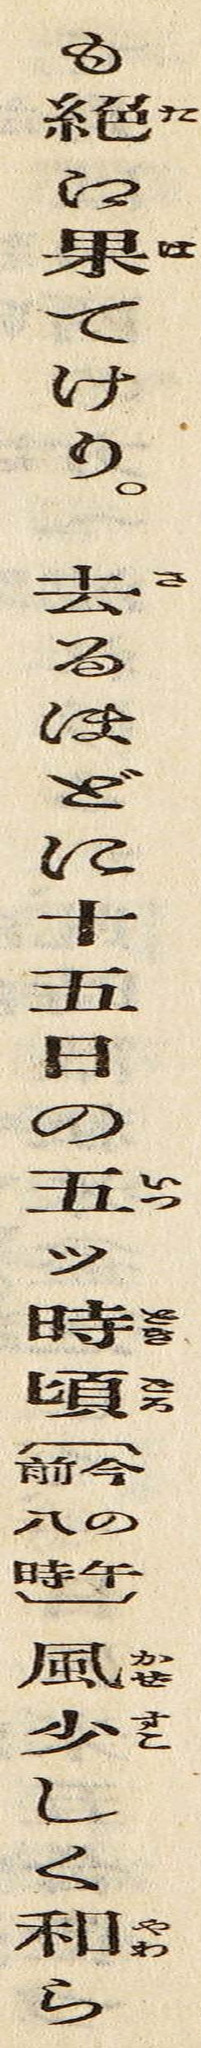も絶え果てけり。去るほどに十五日の五ツ時頃[今の午前八時]風少しく和ら
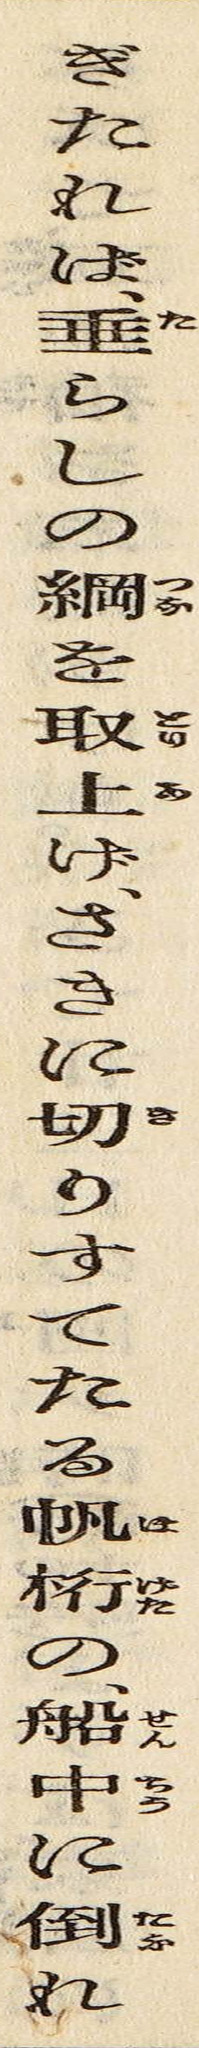ぎたれば、垂らしの綱を取上げ、さきに切りすてたる帆桁の、船中に倒れ
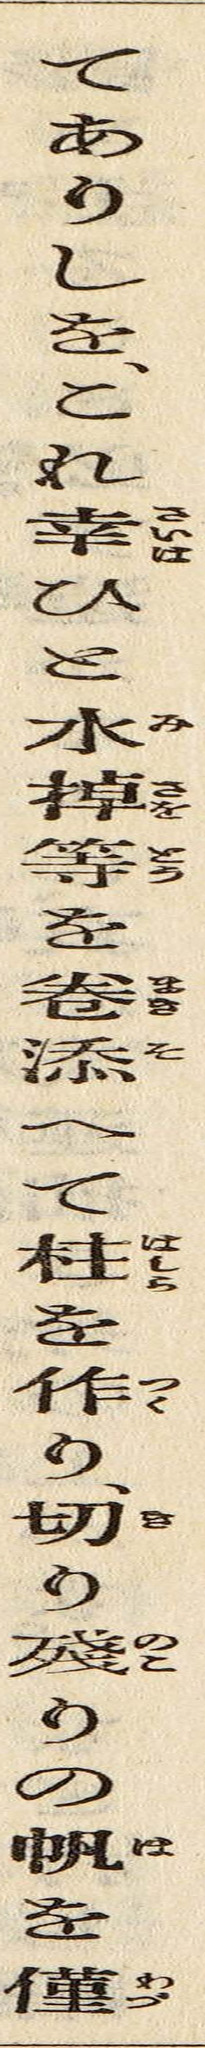てありしを、これ幸ひと水棹等を巻添へて柱を作り、切り残りの帆を僅
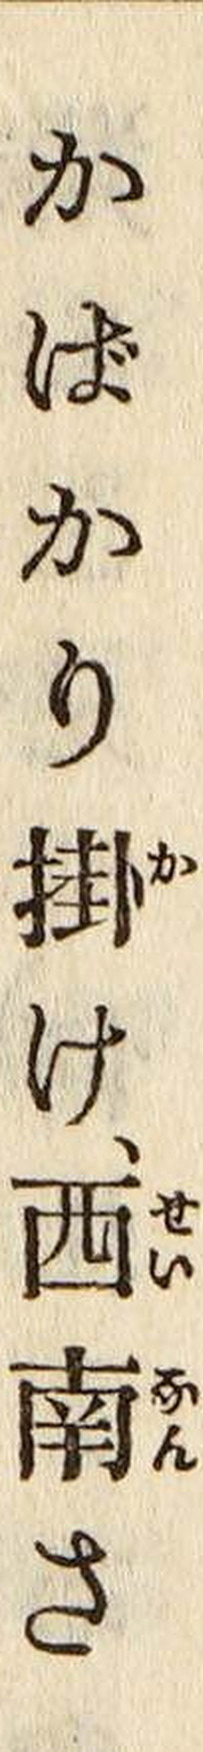かばかり掛け、西南さ
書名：日本漂流譚
